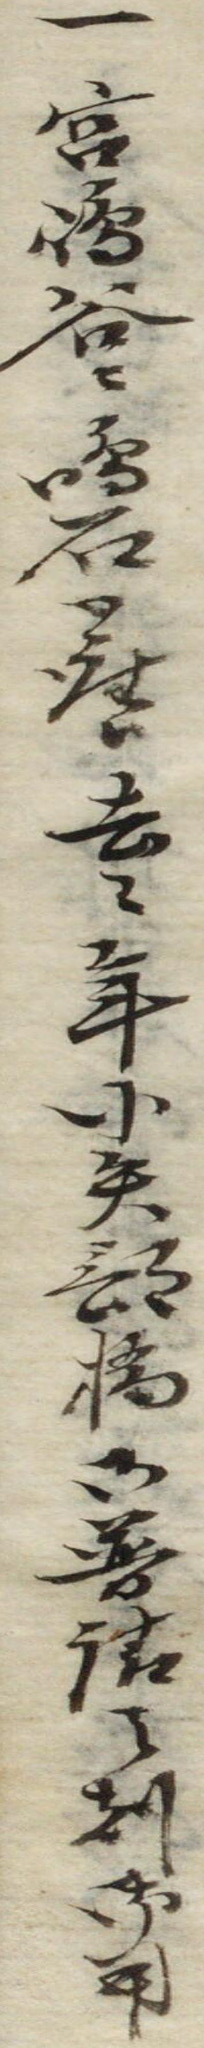一宮嶋谷に鳴石御座候去々年小矢部橋御普請之刻御用

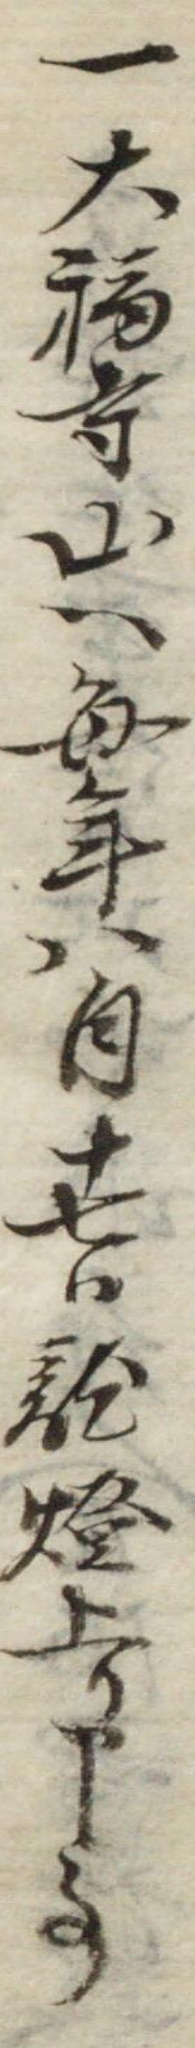一大福寺山へ毎年八月十七日龍燈上り申事
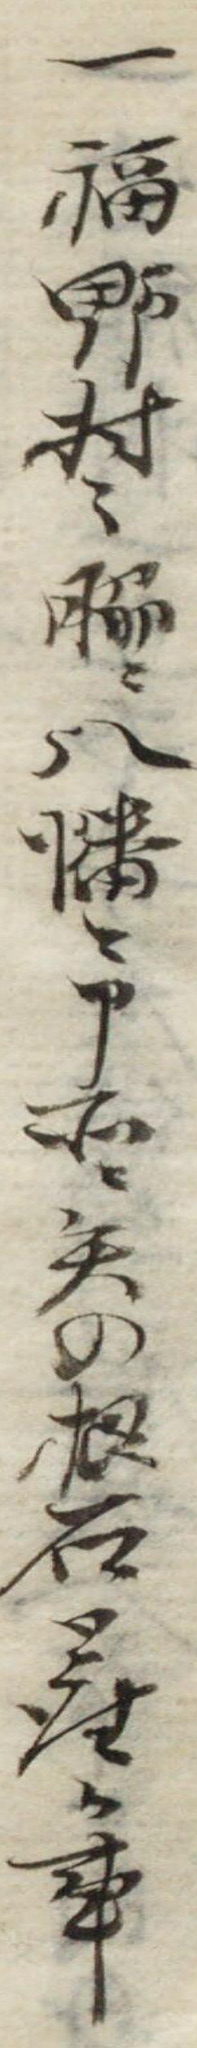一福野村之脇に八幡と申所に矢の根石御座候
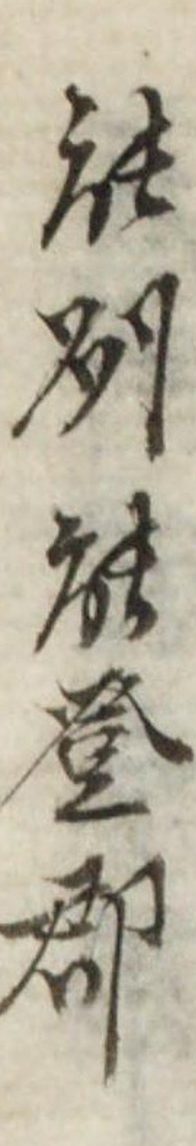能州能登郡
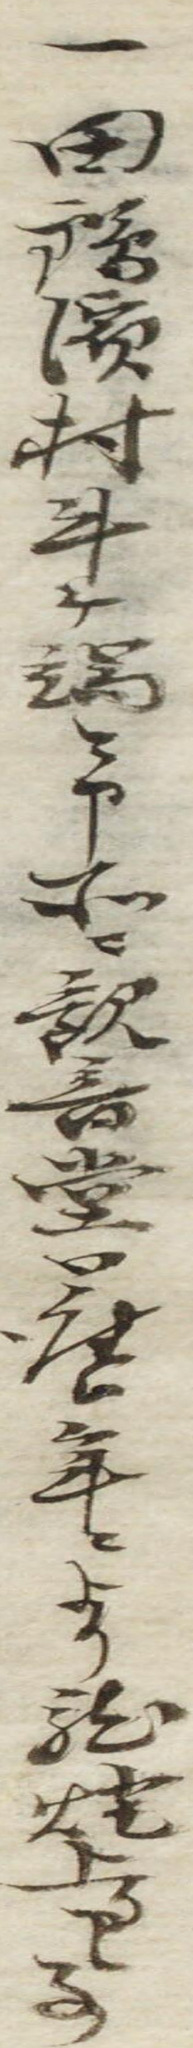一田鶴浜村牛ヶ端と申所に観音堂御座候年により龍燈上り申候事
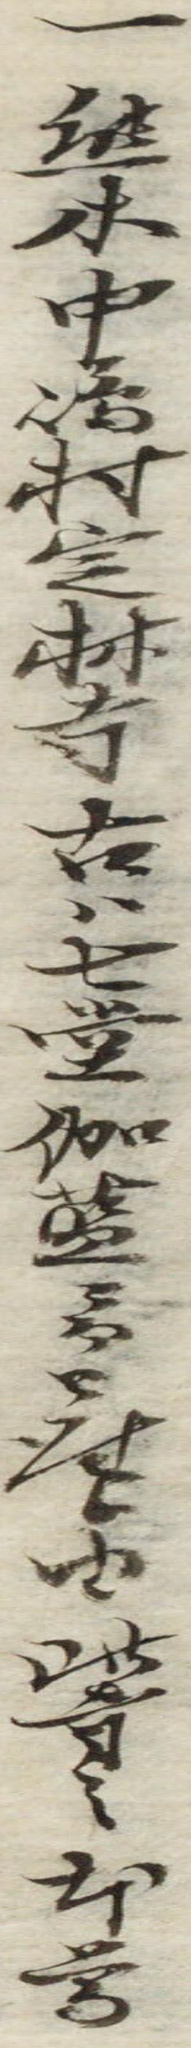一熊木中嶋村定林寺古は七堂伽藍に而御座候由此寺之本尊
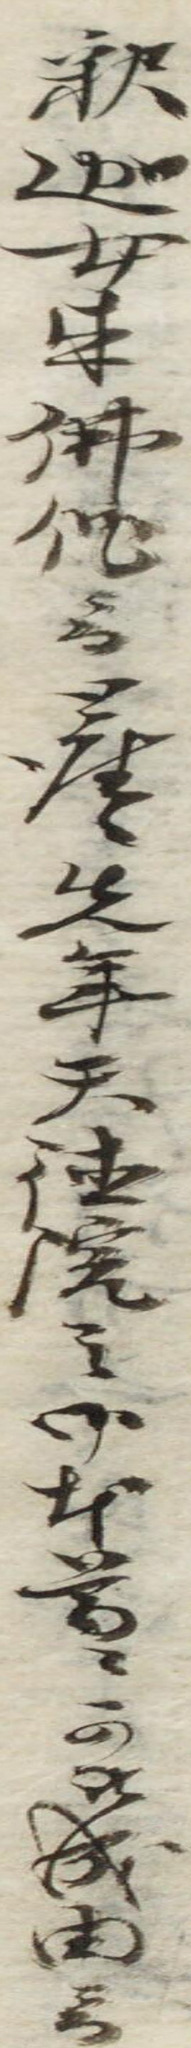釈迦女来仏作に而御座候先年天徳院之御本尊に可被成由に而
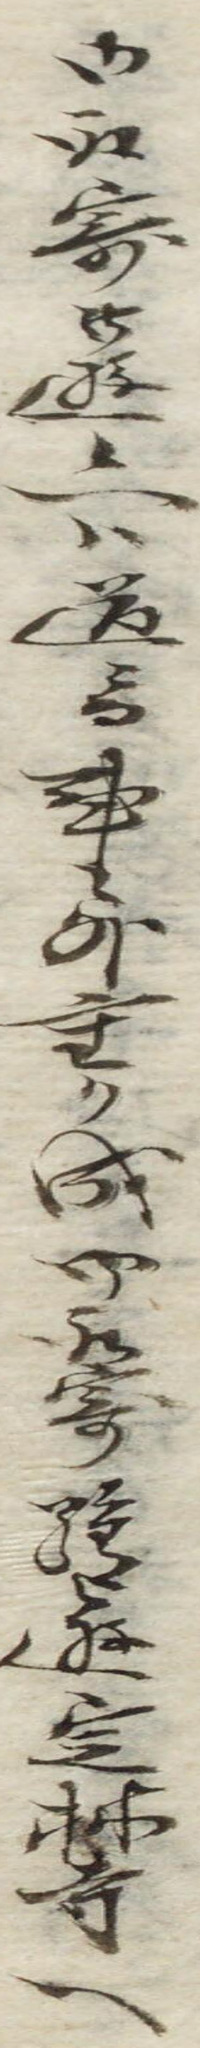御取寄被遊候へは道に而事之外重く成御取寄難被遊定林寺へ
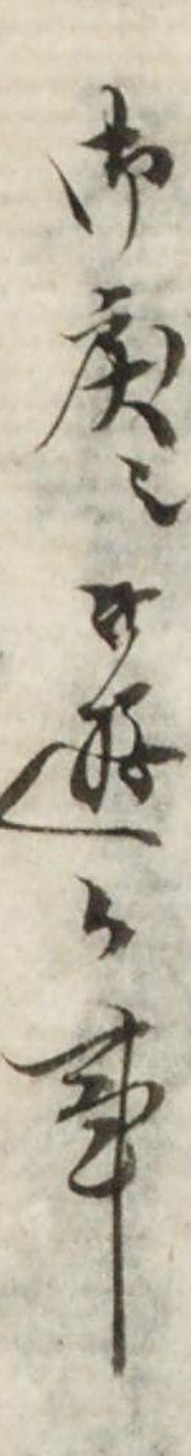御戻し被遊候事
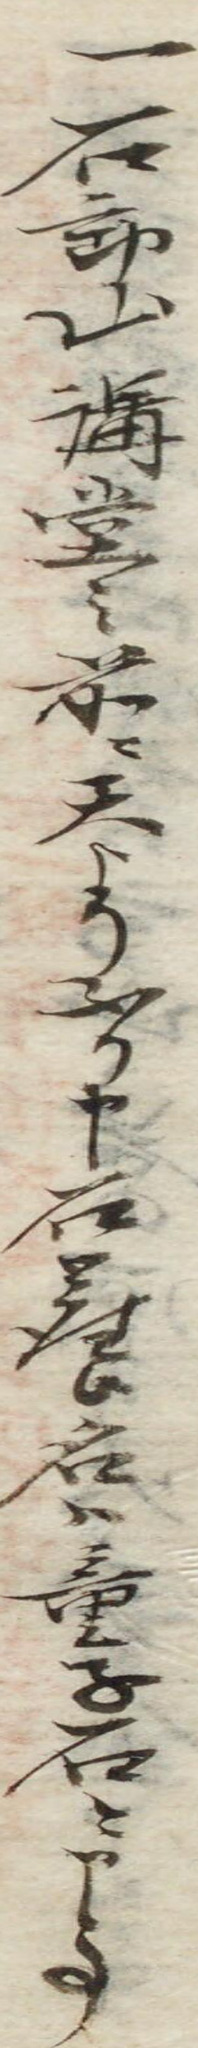一石動山講堂之前に天よりふり申石御座候名は童子石と申事
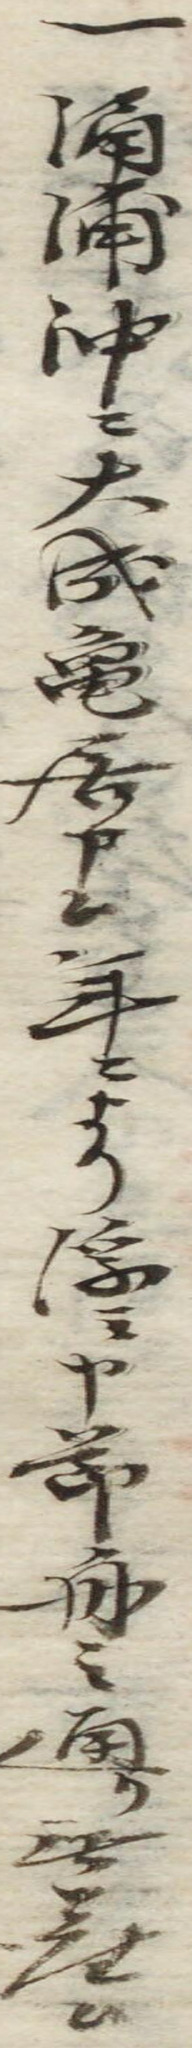一涌浦沖に大成亀居申候年により浮之申節舟之通り無御座候
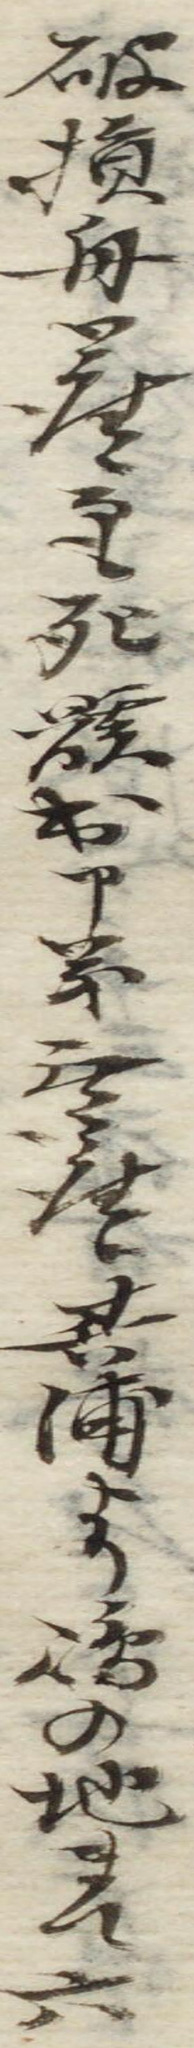破損舟御座候而も死骸出申義無御座候其浦より嶋の地まて六
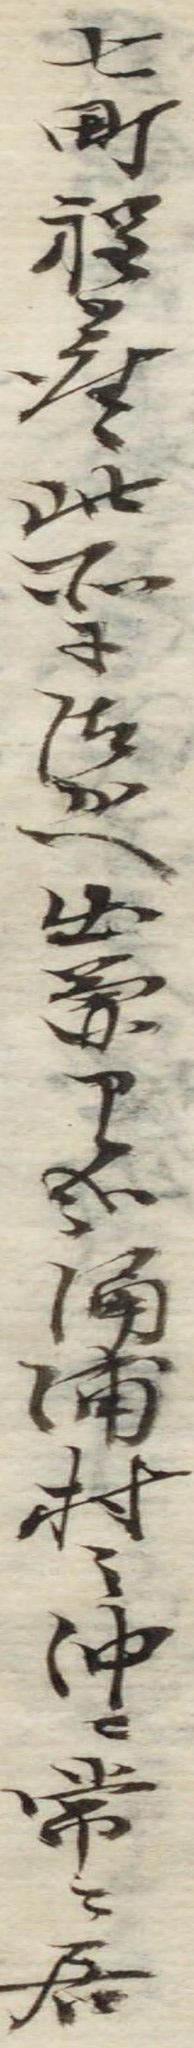七町程御座候此所につかへ出兼申候哉涌浦村之沖に常に居
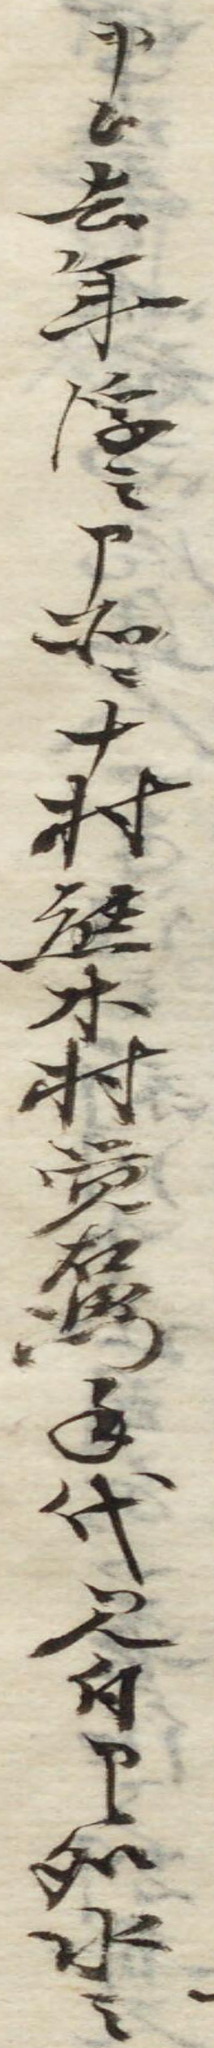申候去年浮之申所に十村熊木村覚右衛門手代見付申候処水之
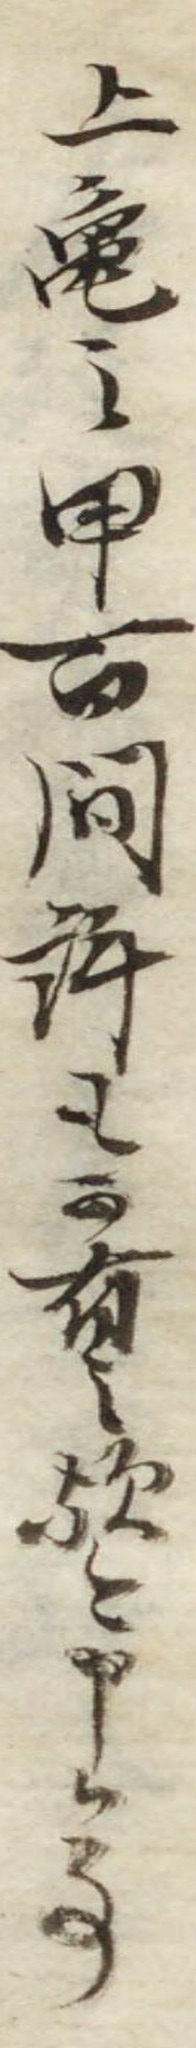上亀之甲百間許も可有之歟と申候事
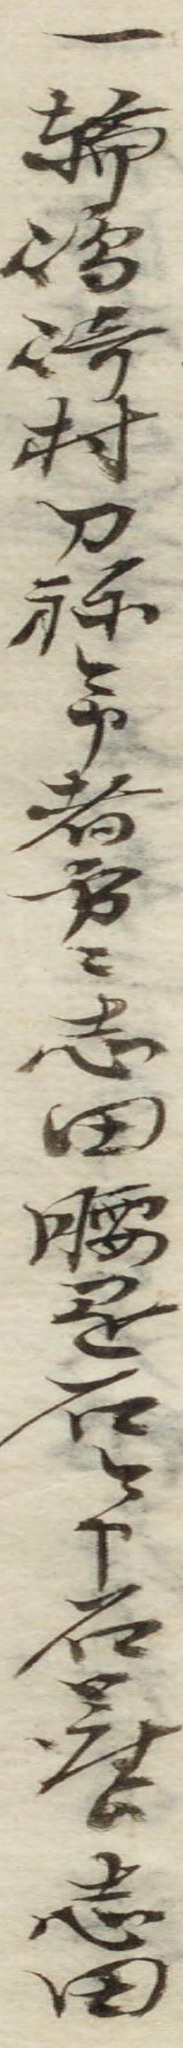一輪嶋崎村刀祢と申者方に志田腰懸石と申石御座候志田
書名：加越能旧聞録
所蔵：Ishikawa Prefectural Library
